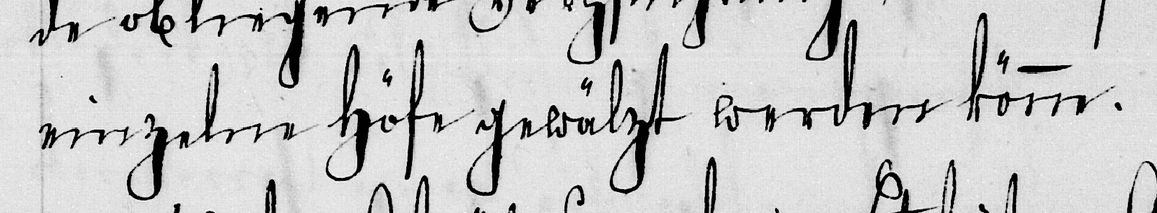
einzelne Höfe gewälzt werden könne.
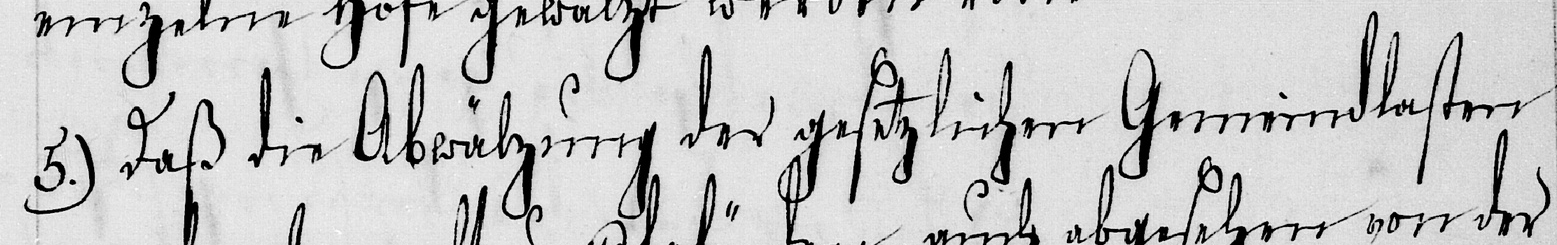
5.) Daß die Abwälzung der gesetzlichen Gemeindlasten
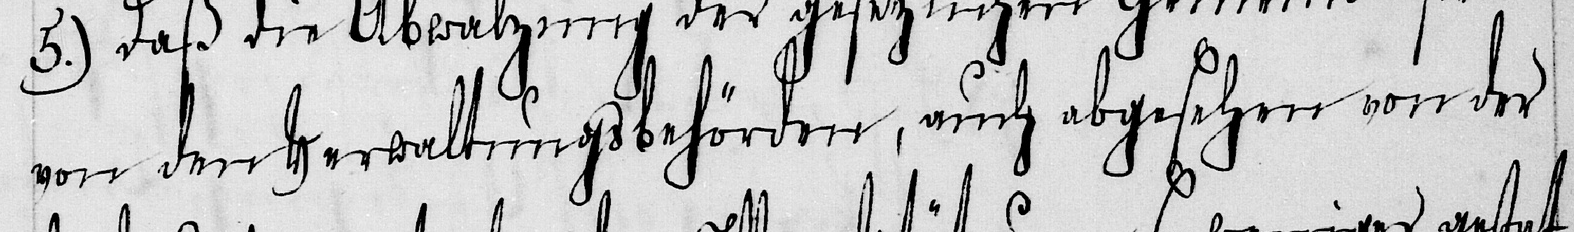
von den Verwaltungsbehörden, auch abgesehen von der
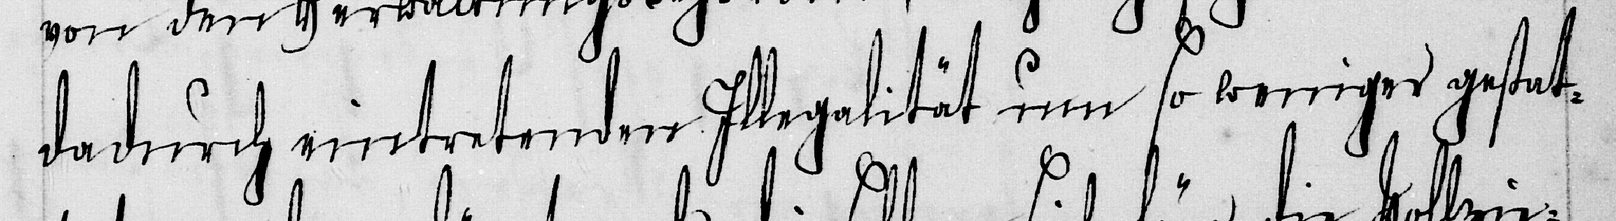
dadurch eintretenden Illegalität um so weniger gestat¬
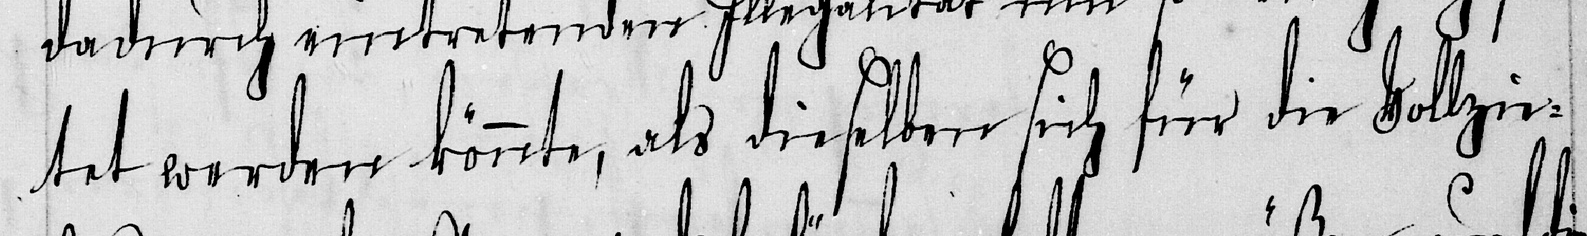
tet werden könnte, als dieselben sich für die Vollzie¬
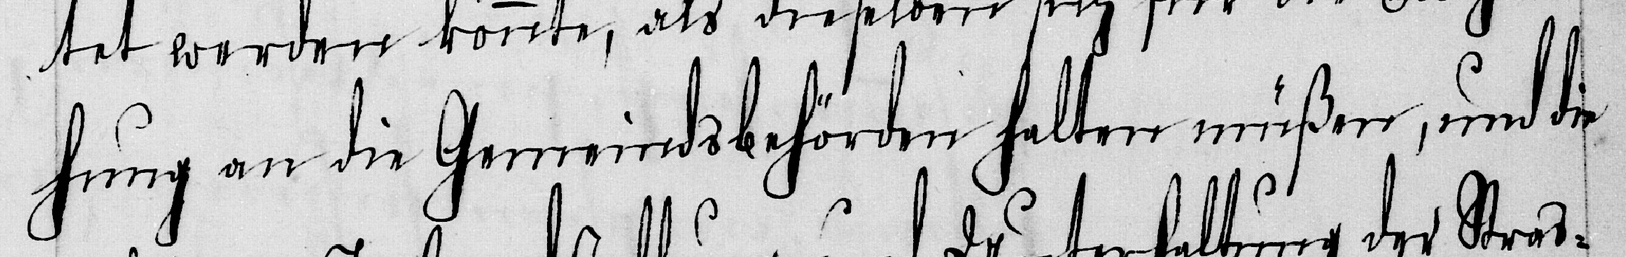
hung an die Gemeindsbehörden halten müßen, und
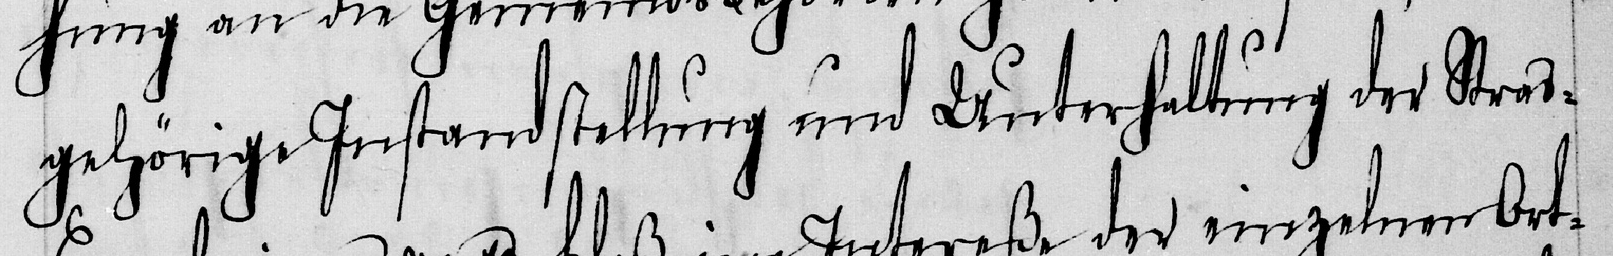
gehörige Instandstellung und Unterhaltung der Straß¬
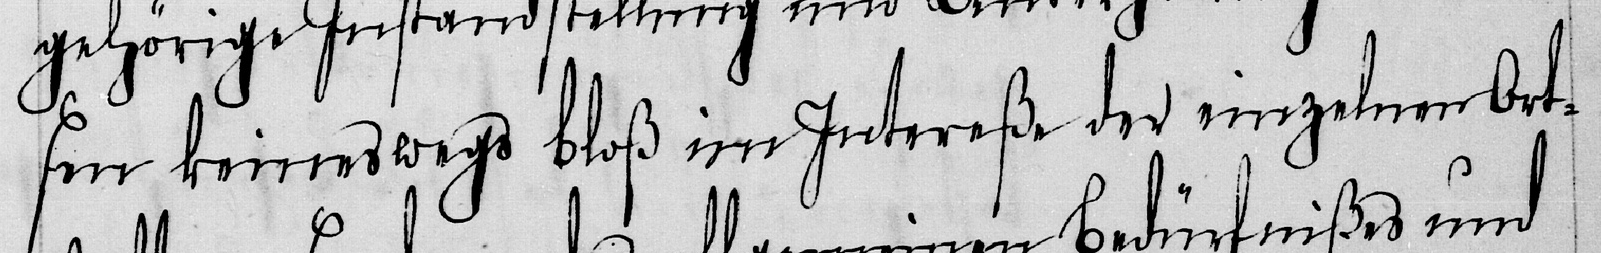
en keineswegs bloß im Intereße der einzelnen Ort¬
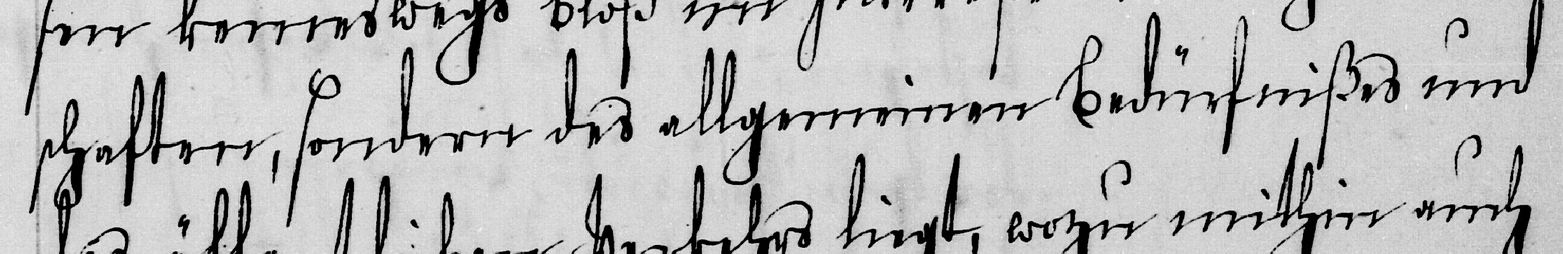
schaften, sondern des allgemeinen Bedürfnißes und
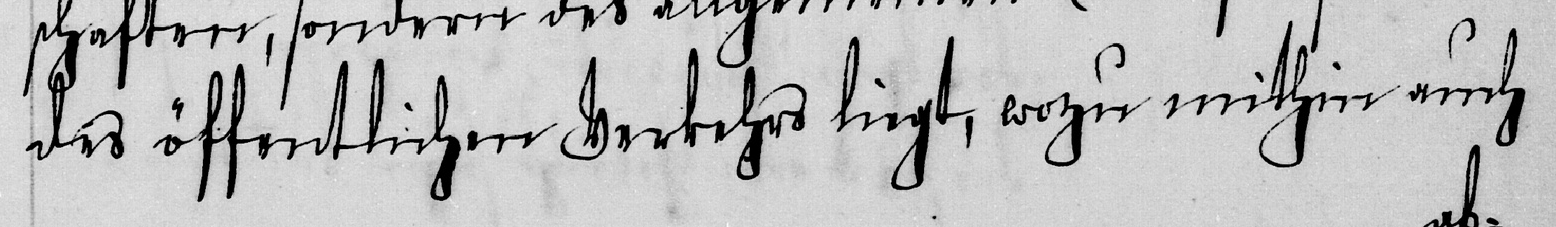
des öffentlichen Verkehrs liegt, wozu mithin auch
